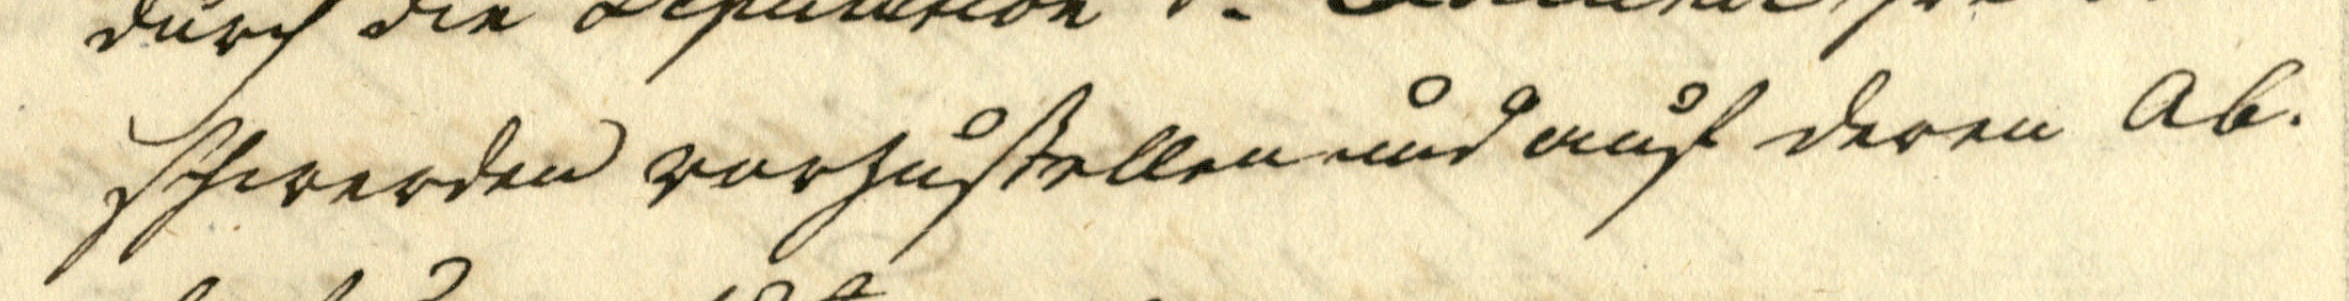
schwerden vorzustellen und auf deren Ab¬
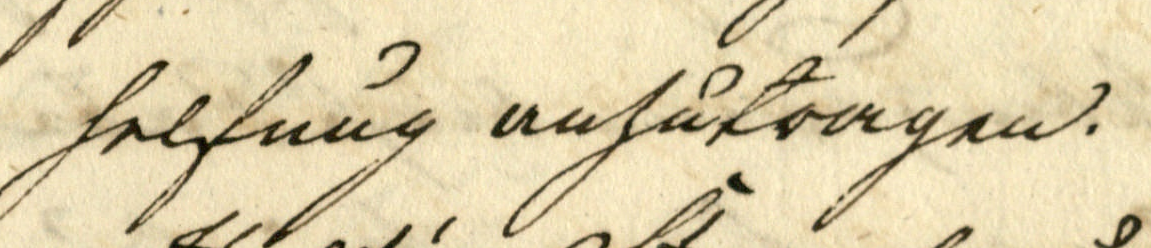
helfung anzutragen.
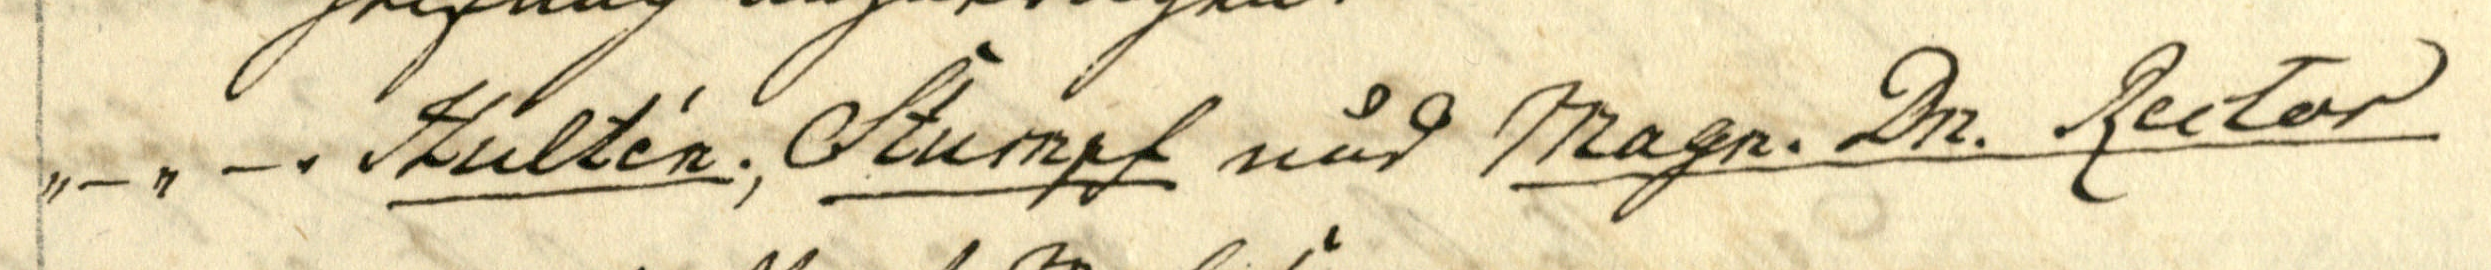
Hultén.; Stumpf und Magn. Dn. Rector
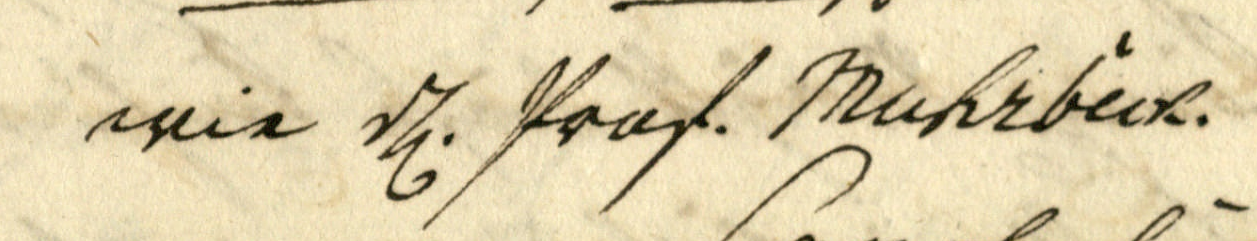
wie dh. Prof. Muhrbeck
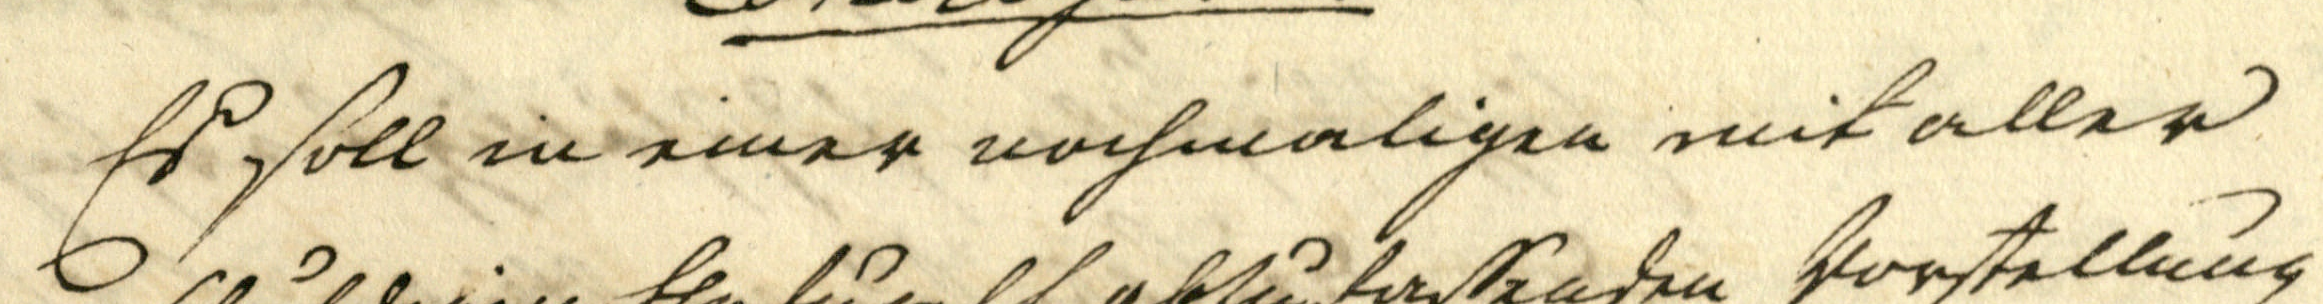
Es soll in einer nochmaligen mit aller
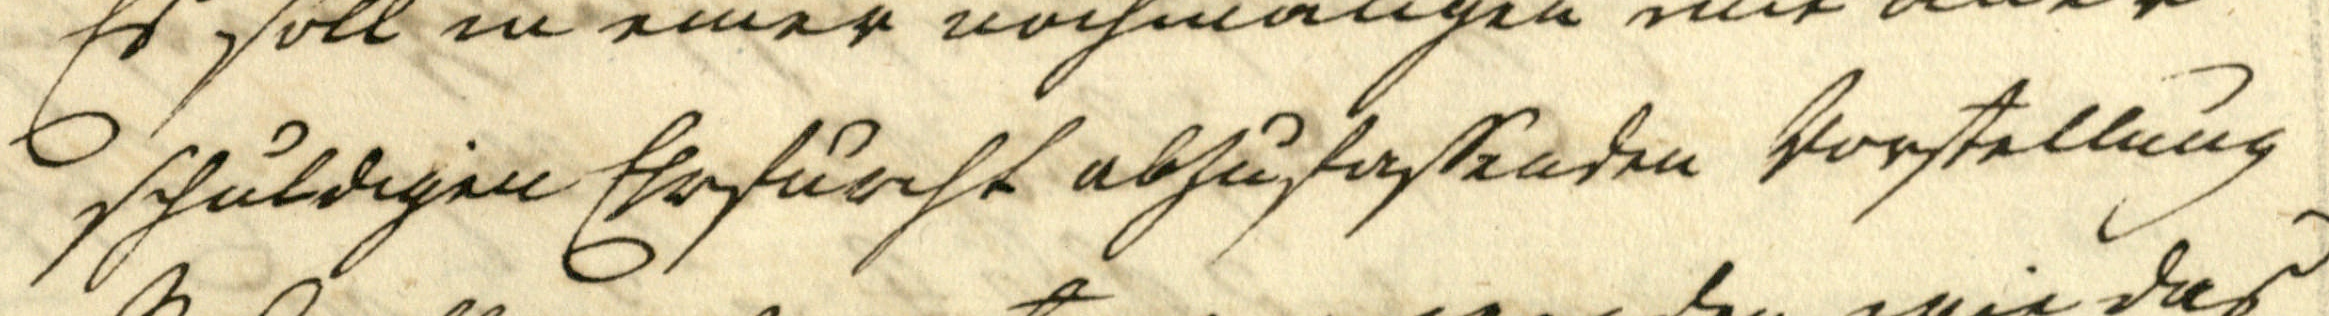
schuldigen Ehrfurcht abzufassenden Vorstellung
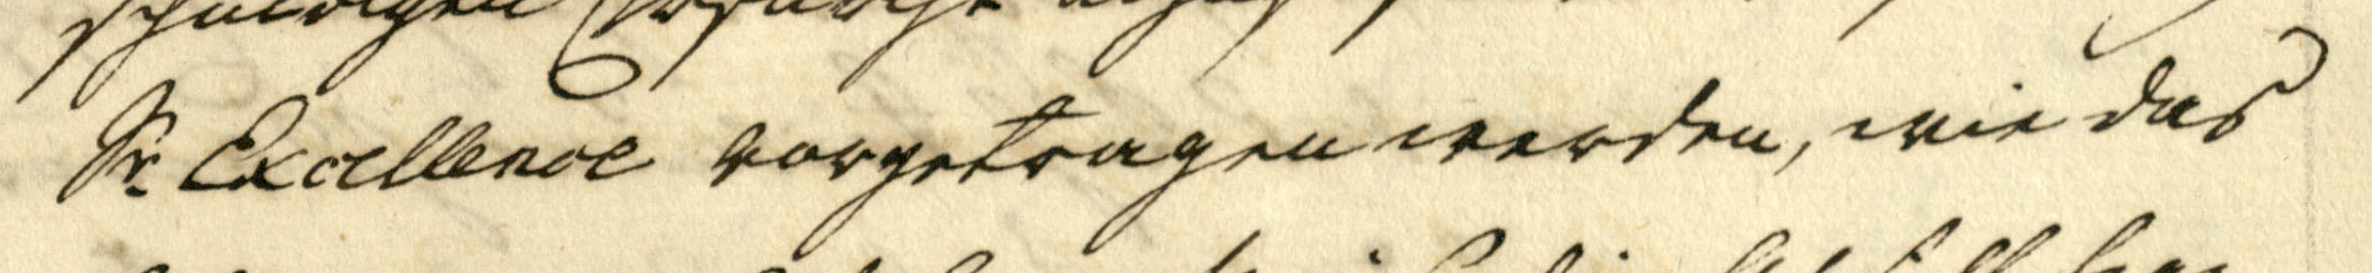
Sr Excellence vorgetragen werden, wie das
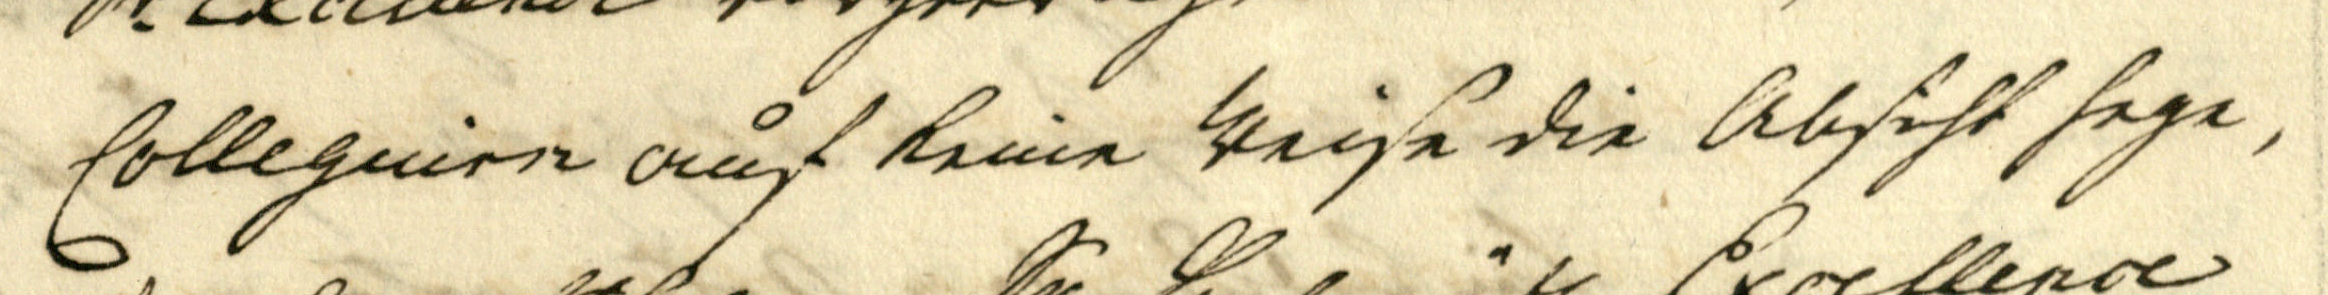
Collegium auf keine Weise die Absicht hege,
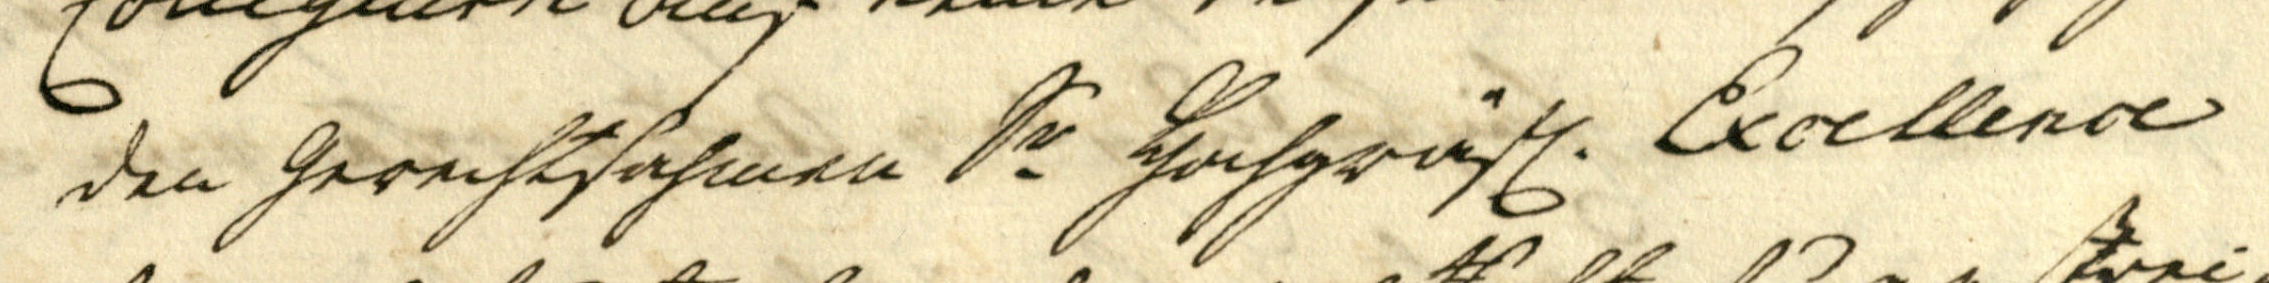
den Gerechtsahmen Sr Hochgräfl. Excellence
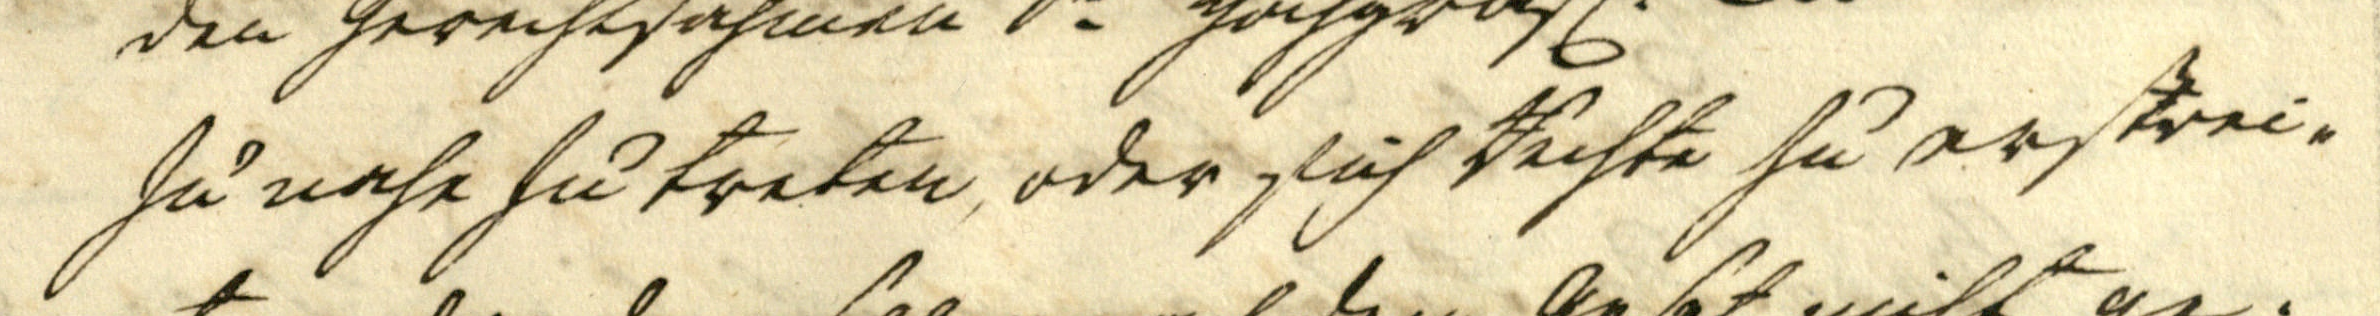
zu nahe zu treten, oder sich Rechte zu erstrei¬
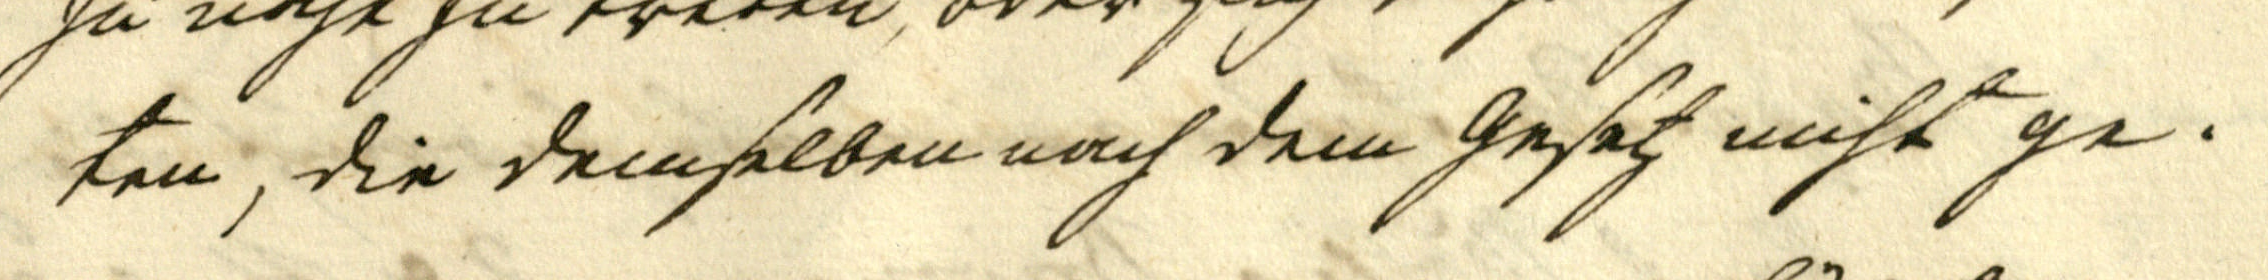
ten, die demselben nach dem Gesetz nicht ge¬
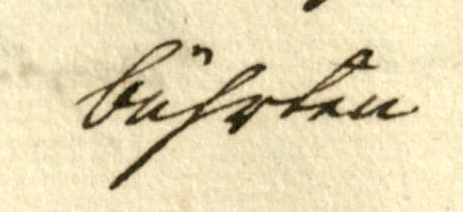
bührten
